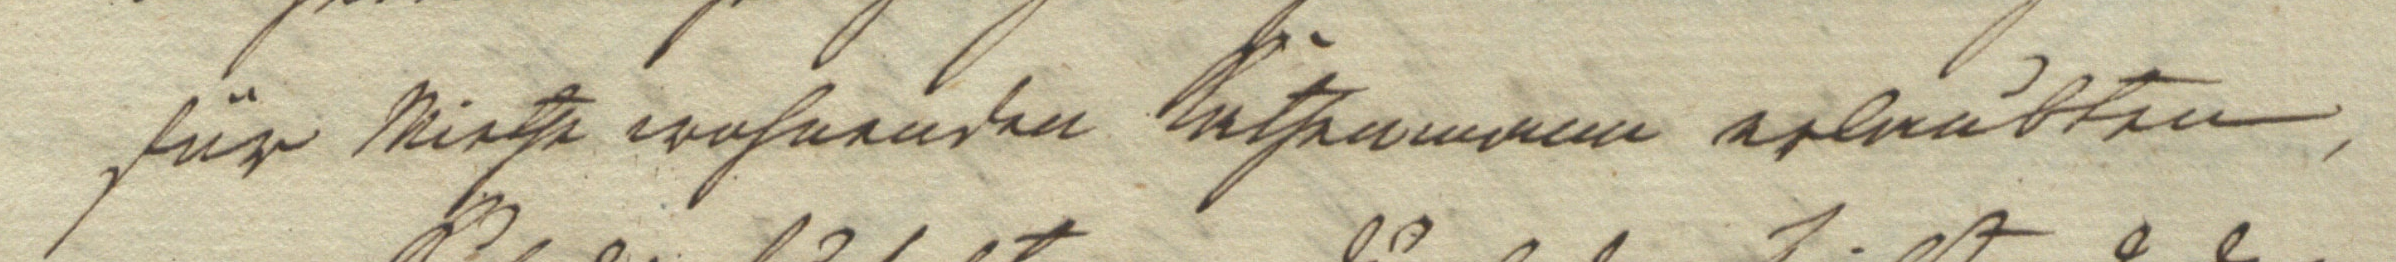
für Miethe wohnenden Kathenmann erlaubten
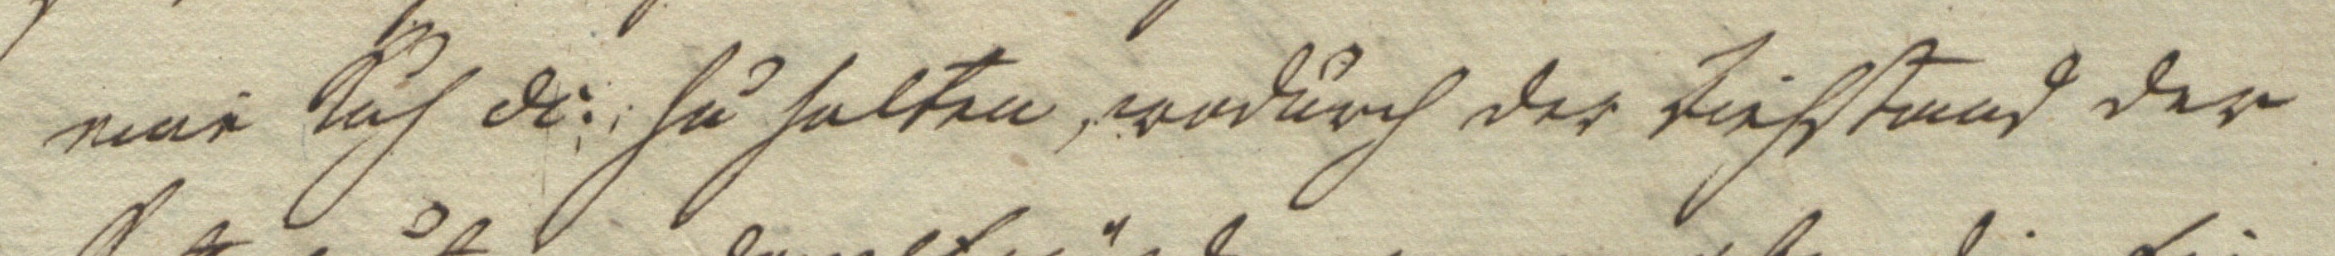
eine Kuh etc. zu halten, wodurch der Viehstand der
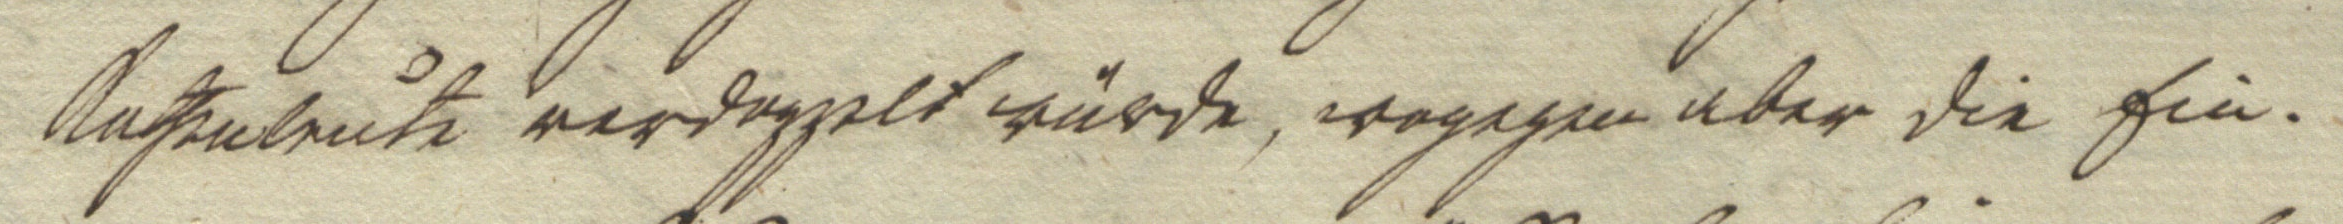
Kathenleute verdoppelt würde, wogegen aber die Ein¬
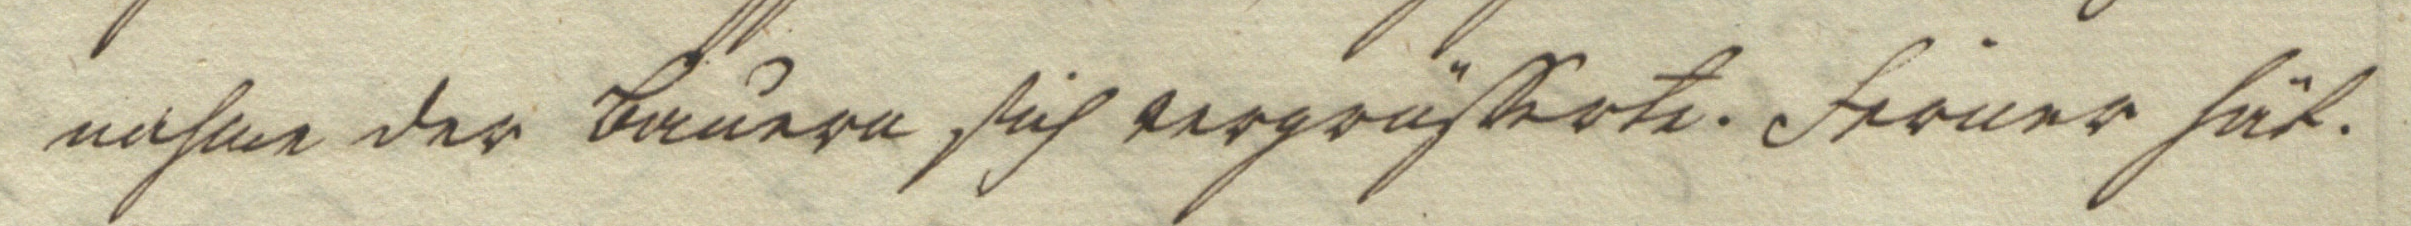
nahme der Bauern sich vergrösserte. Ferner hät¬
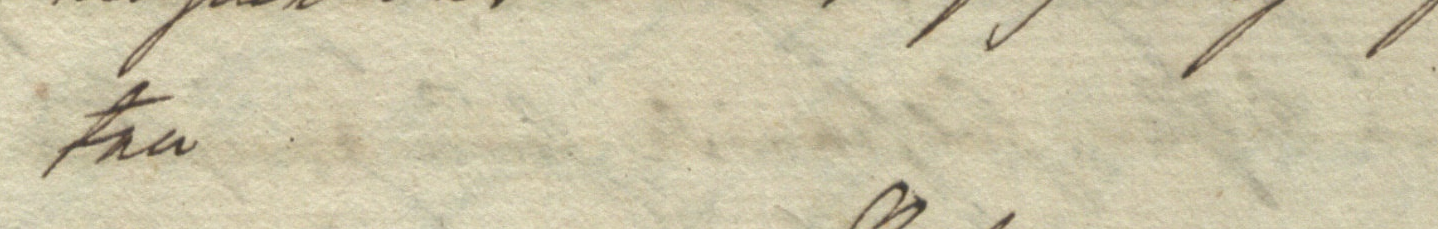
ten
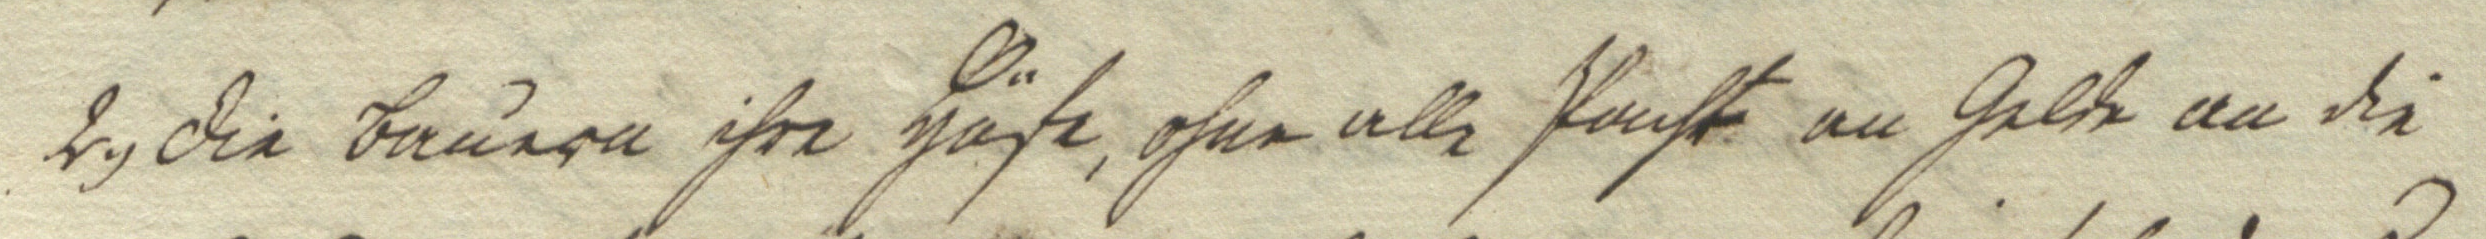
2., die Bauern ihre Höfe, ohne alle Pacht an Gelde an die
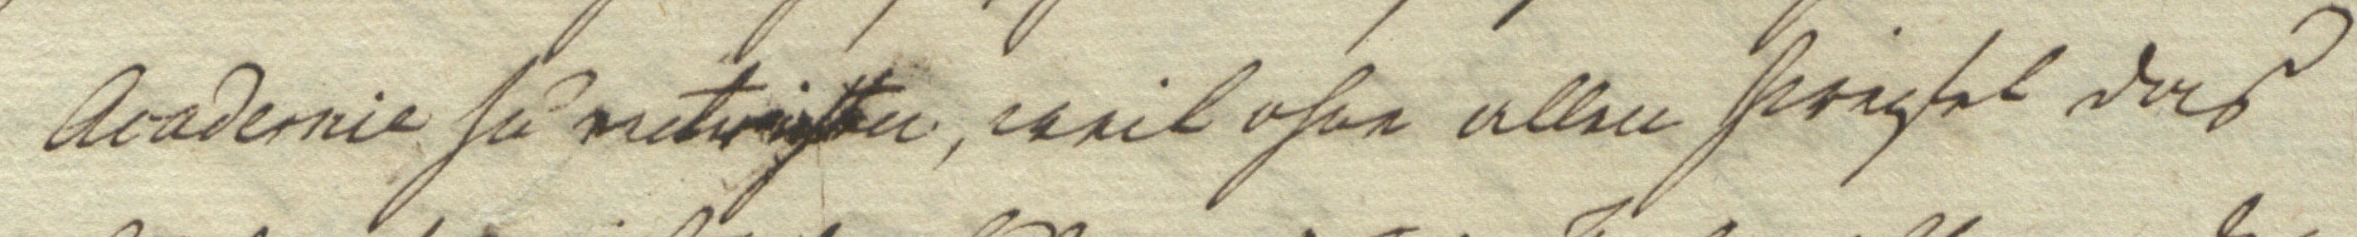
Academie zu entrichten, weil ohne allen Zweifel das
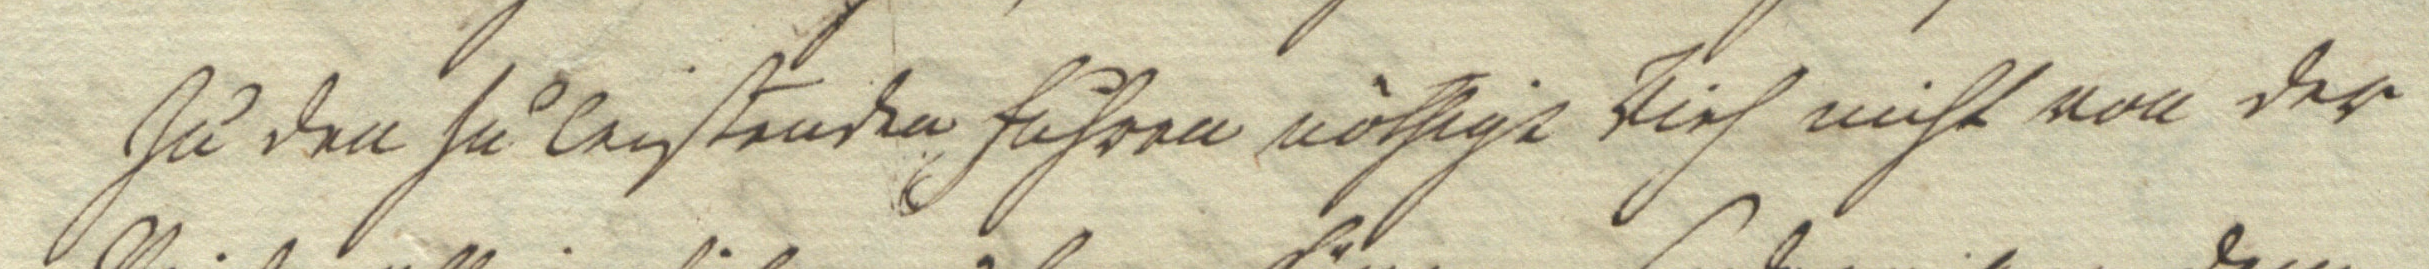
zu den zu leistenden Fuhren nöthige Vieh nicht von der
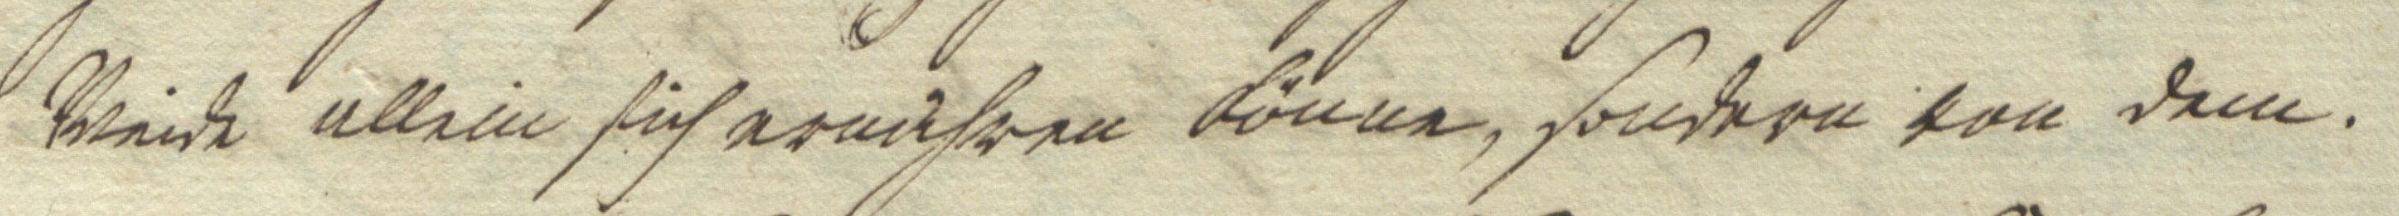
Weide allein sich ernähren könne, sondern von dem¬
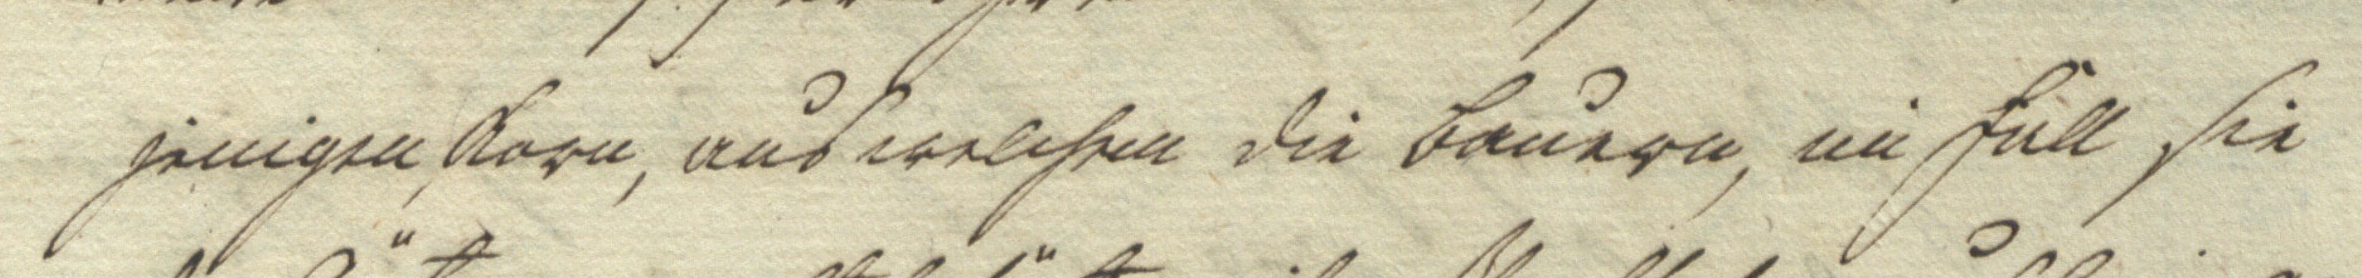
jenigen Korn, aus welchen die Bauern, im Fall sie
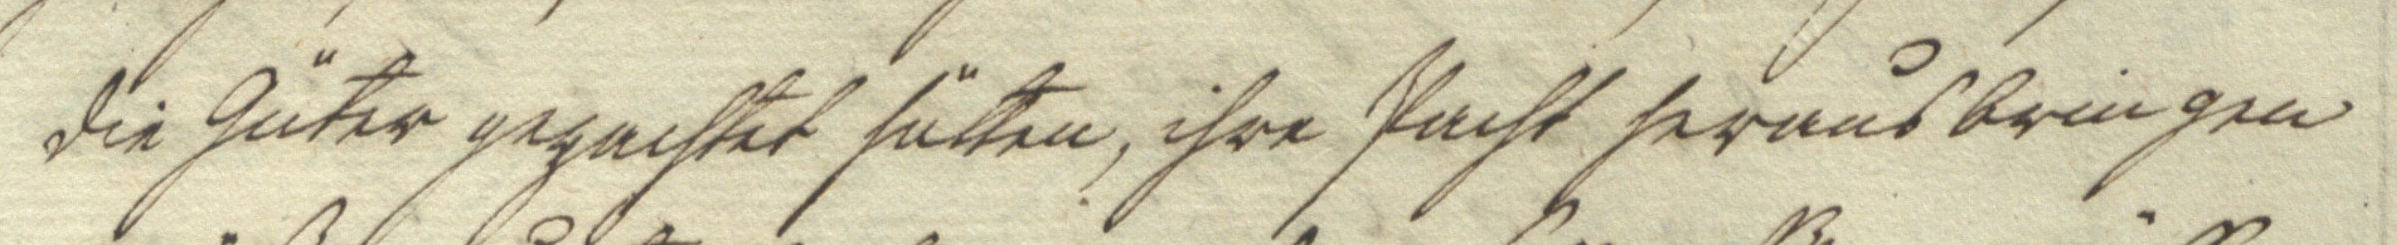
die Güter gepachtet hätten, ihre Pacht herausbringen
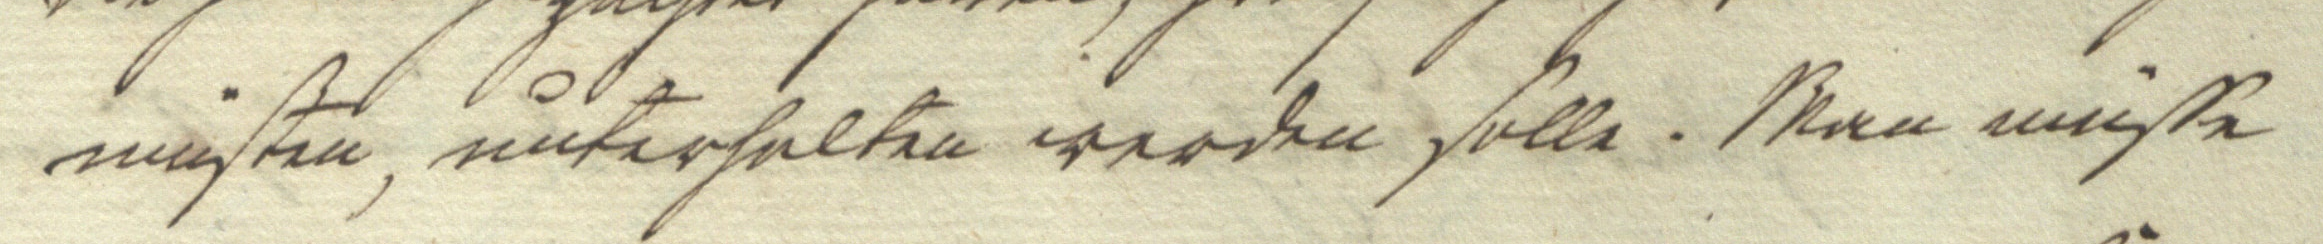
müßten, unterhalten werden solle. Man müsse
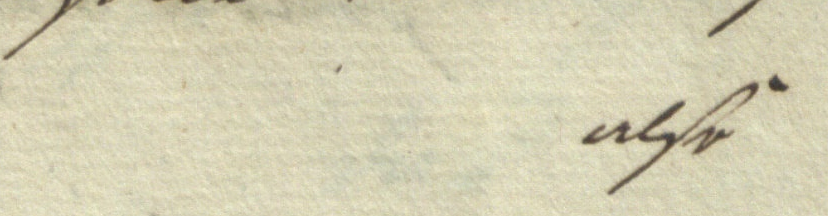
also
